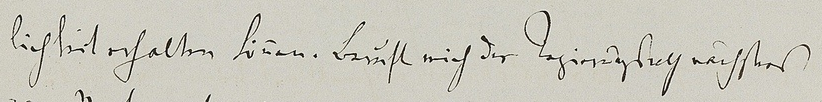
lichkeit erhalten können. Beruft mich der Regierungsrath nächstens
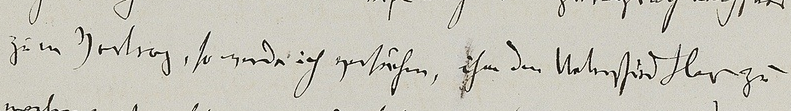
zum Vortrag, so werde ich versuchen, ihm den Unterschied klar zu
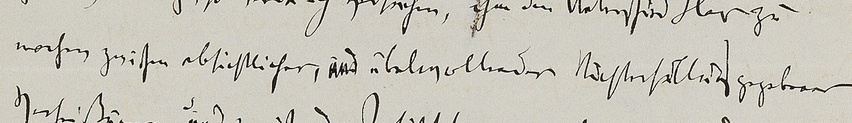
machen zwischen absichtlicher,und übelwollender Nichterfüllung gegebener
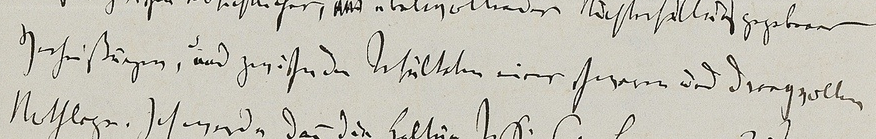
Verheißungen, und zwischen den Resultaten einer schweren und drangvollen
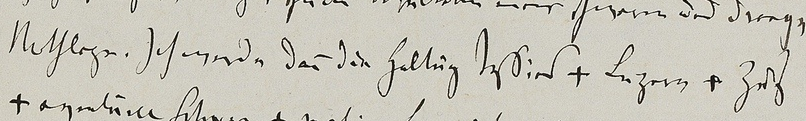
Nothlage. Ich werde dann die Haltung Tessins + Luzern + Zug
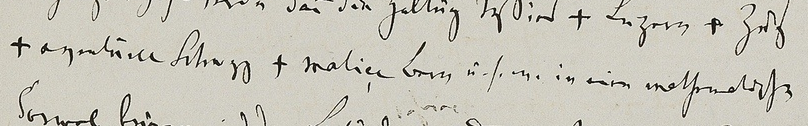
eventuell Schwyz + malice Bern u. s. w. in eine mathematische
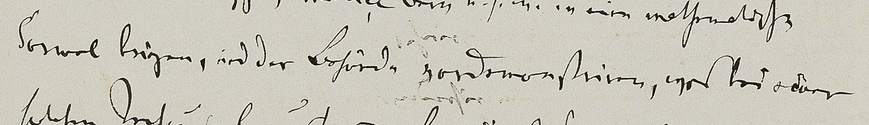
Formel bringen, und der Behörde vordemonstriren, was bei einer
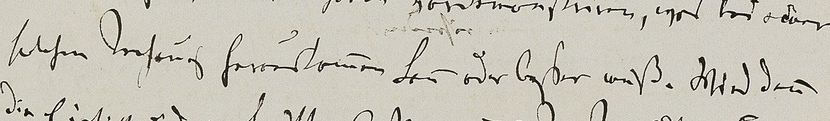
solchen Rechnung herauskommen kann oder besser muß. Wird dann
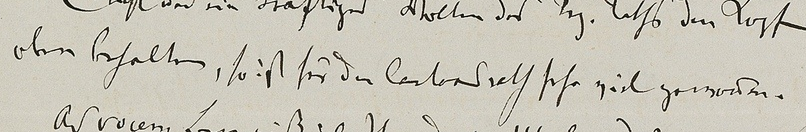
oben behalten, so ist für den Cantonsrath sehr viel gewonnen.
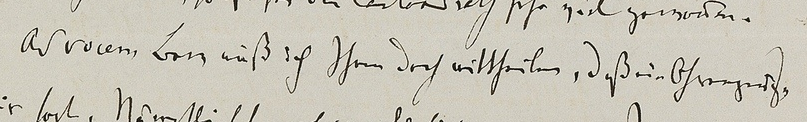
Ad vocem Bern muß ich Ihnen doch mittheilen, daß ein Ohrenzeuge
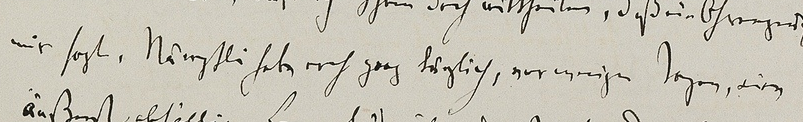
mir sagt, Stämpfli habe noch ganz kürzlich, vor einigen Tagen, eine
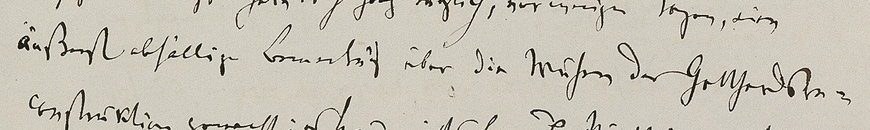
äußerst abfällige Bemerkung über die Mühen der GotthardRe-
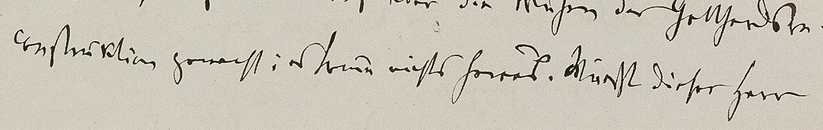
construction gemacht; es komme nichts heraus. Wünscht dieser Herr
